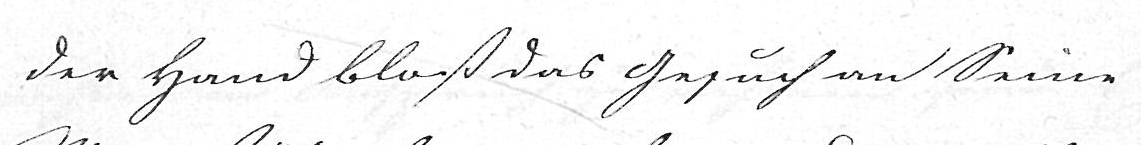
der Hand bloß das Gesuch an Seine
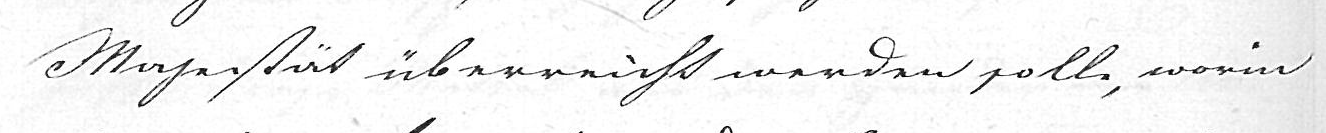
Majestät überreicht werden solle, worin
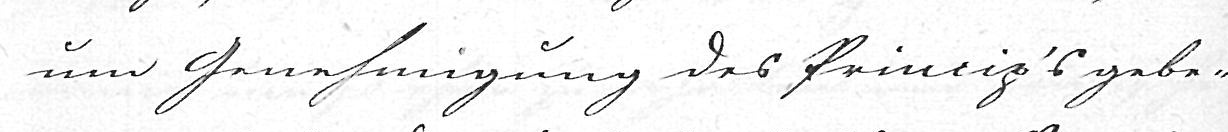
um Genehmigung des Princip's gebe-
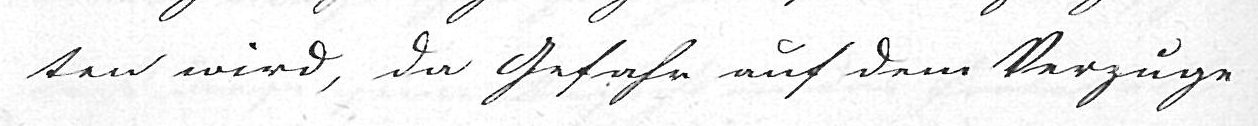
ten wird, da Gefahr auf dem Verzuge
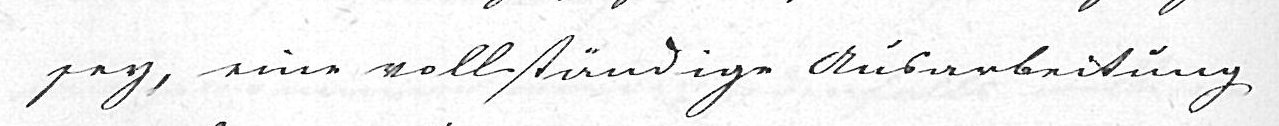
sey, eine vollständige Ausarbeitung
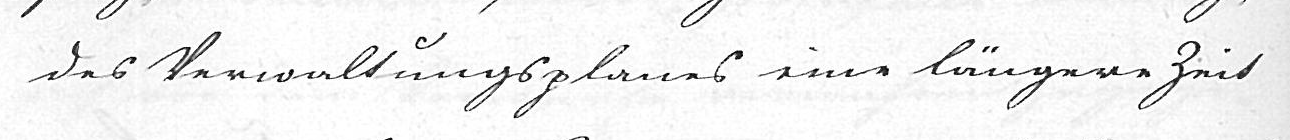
des Verwaltungsplanes eine längere Zeit
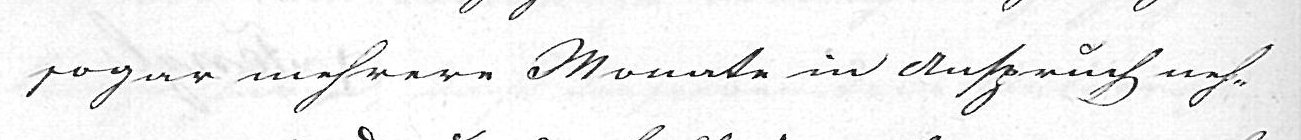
sogar mehrere Monate in Anspruch neh-
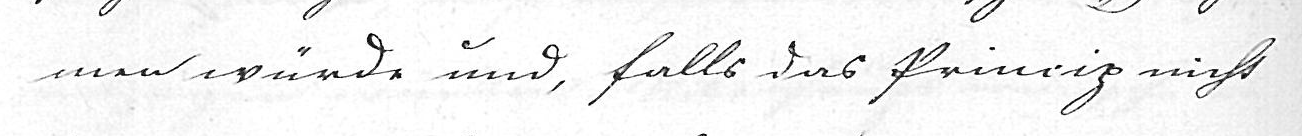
men würde und, falls das Princip nicht
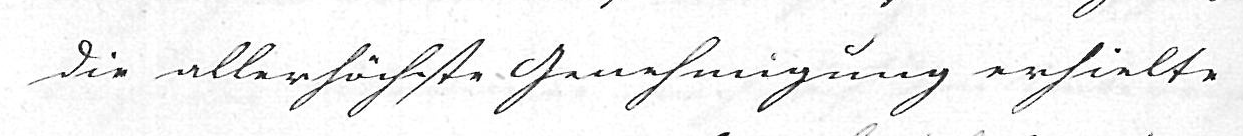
die allerhöchste Genehmigung erhielte
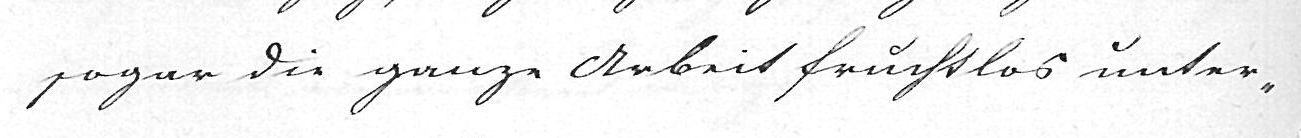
sogar die ganze Arbeit fruchtlos unter-
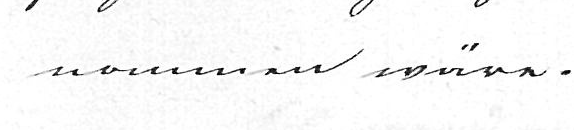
nommen wäre.
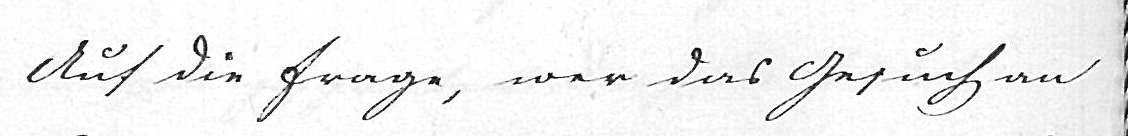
Auf die Frage, wer das Gesuch an
